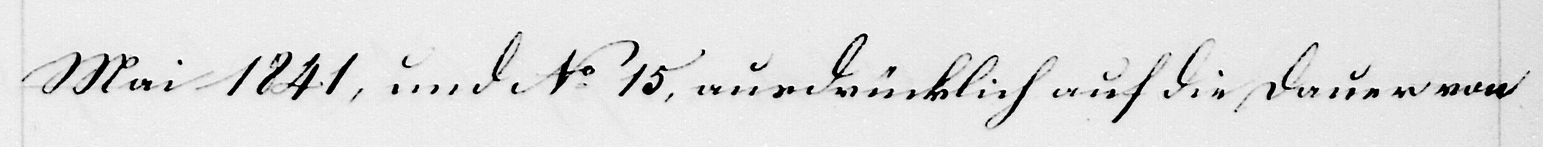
Mai 1841, und No 15, ausdrücklich auf die Dauer von
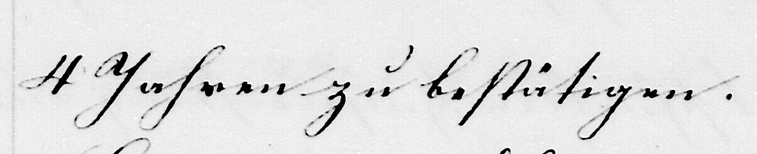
4 Jahren zu bestätigen.
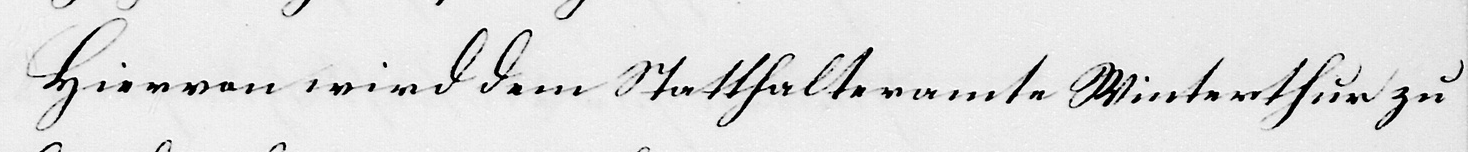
Hiervon wird dem Statthalteramte Winterthur zu
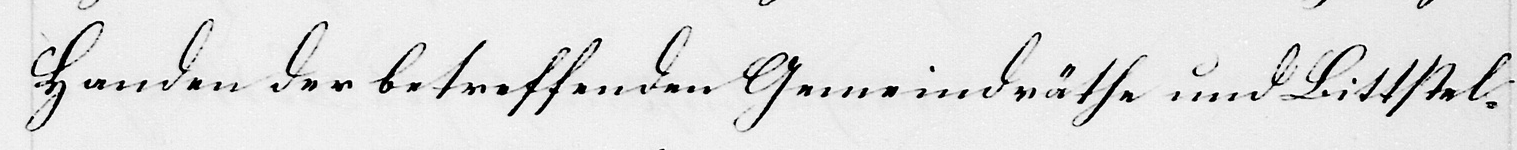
Handen der betreffenden Gemeindräthe und Bittstel¬
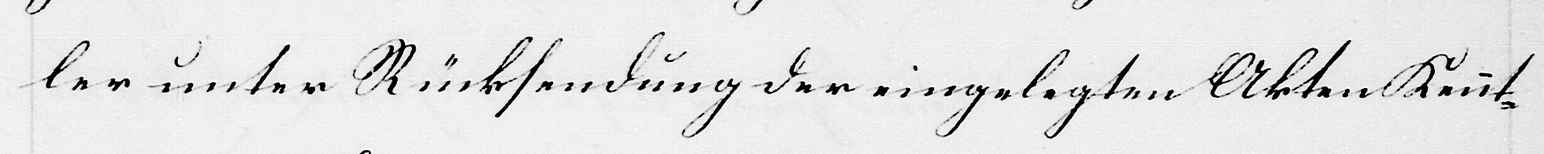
ler unter Rücksendung der eingelegten Akten Kennt¬
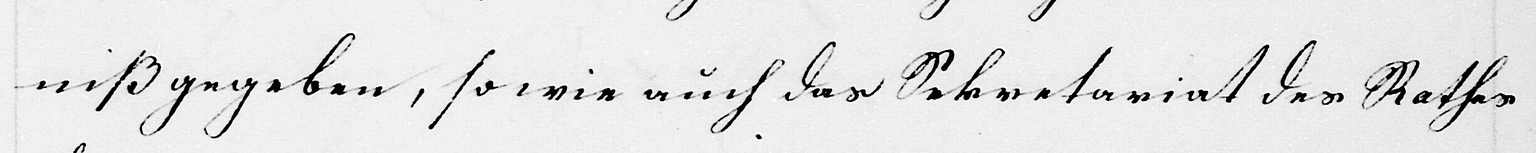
niß gegeben, sowie auch das Sekretariat des Rathes
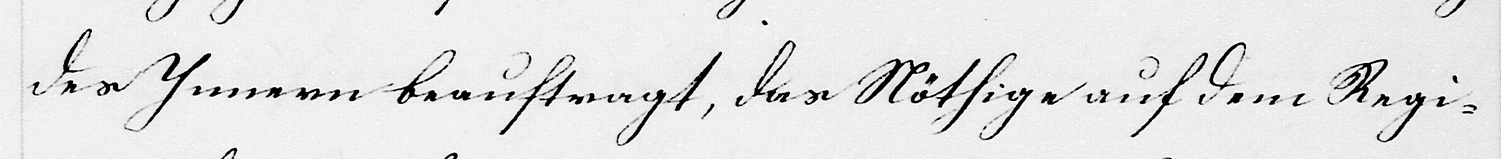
des Innern beauftragt, das Nöthige auf dem Regi¬
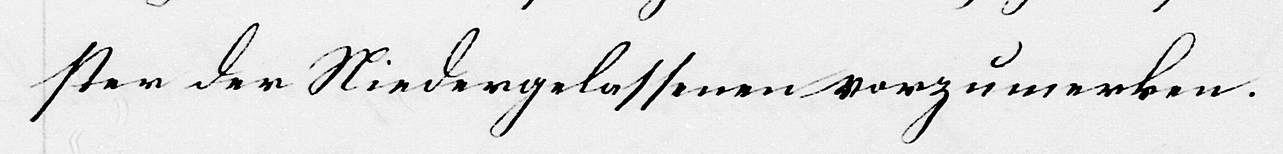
ster der Niedergelassenen vorzumerken.
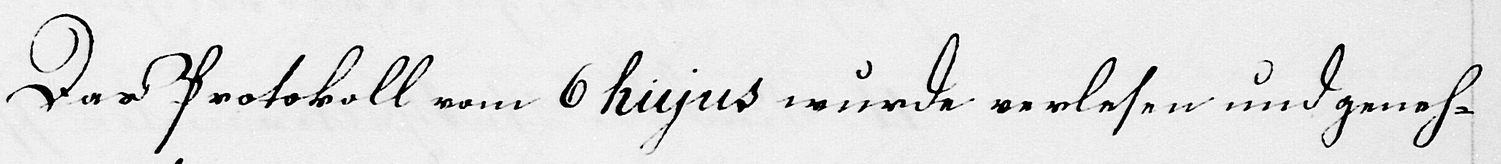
Das Protokoll vom 6 hujus wurde verlesen und geneh¬
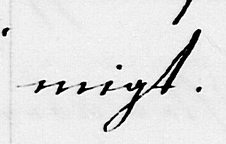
migt.
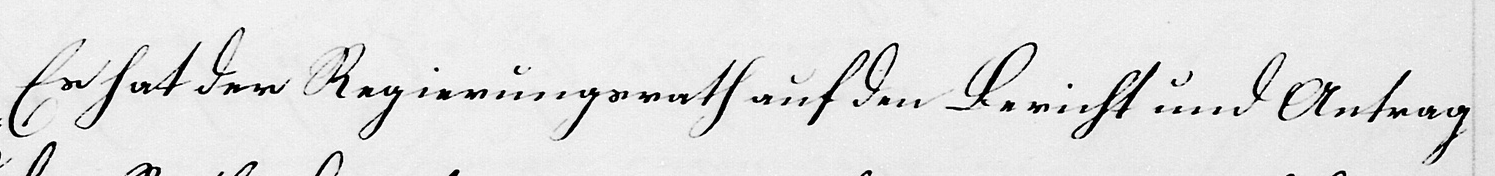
Es hat der Regierungsrath auf den Bericht und Antrag
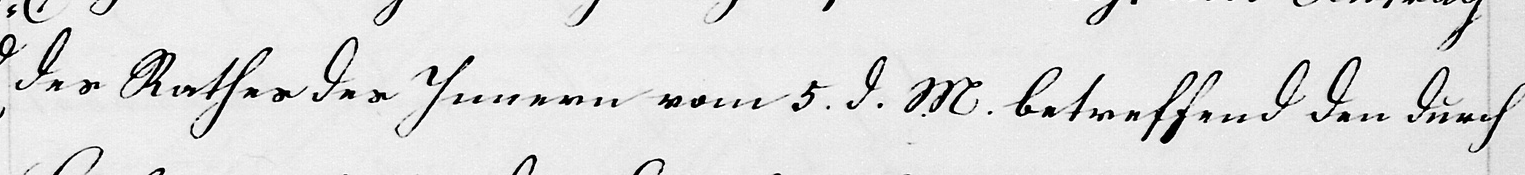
des Rathes des Innern vom 5. d. M. betreffend den durch
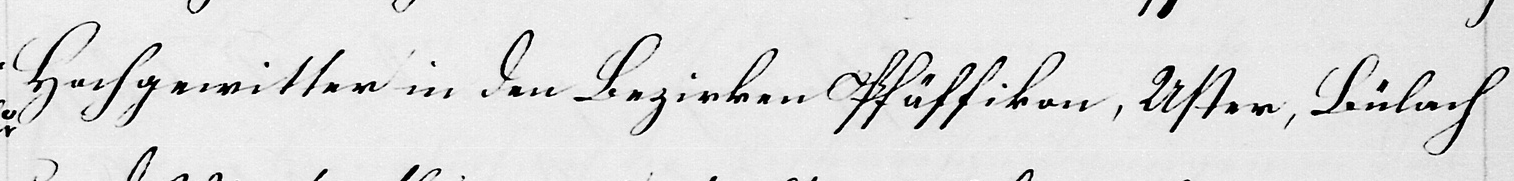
Hochgewitter in den Bezirken Pfäffikon, Uster, Bülach
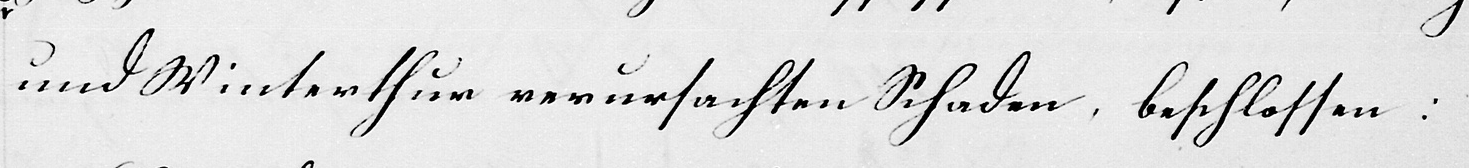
und Winterthur verursachten Schaden, beschloßen:
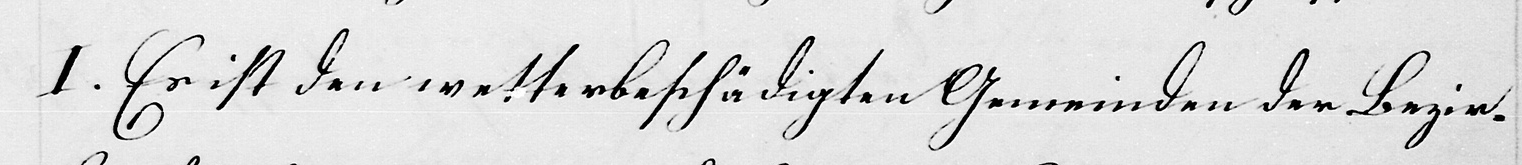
I. Es ist den wetterbeschädigten Gemeinden der Bezir¬
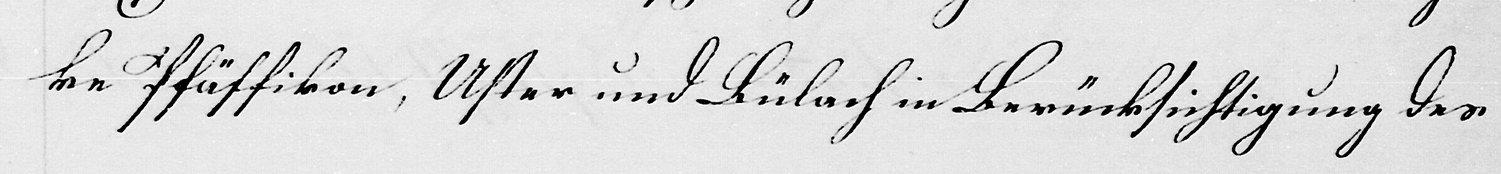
ke Pfäffikon, Uster und Bülach in Berücksichtigung des
